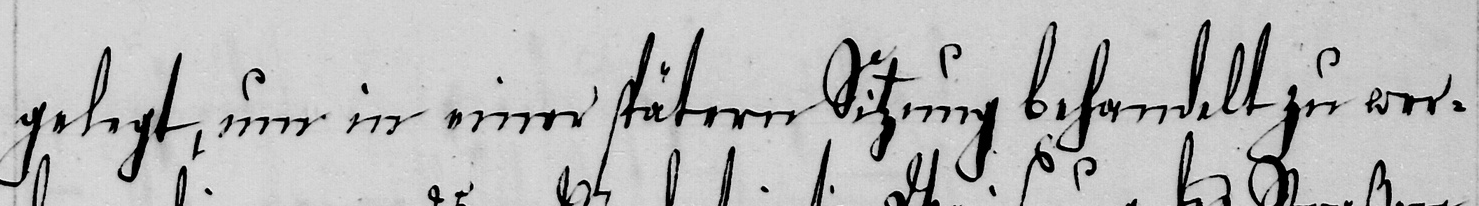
gelegt, um in einer spätern Sitzung behandelt zu wer¬
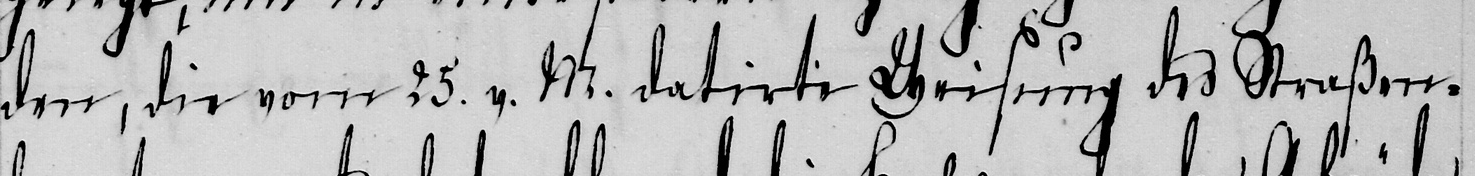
den, die vom 25. v. M. datirte Weisung des Straßen¬
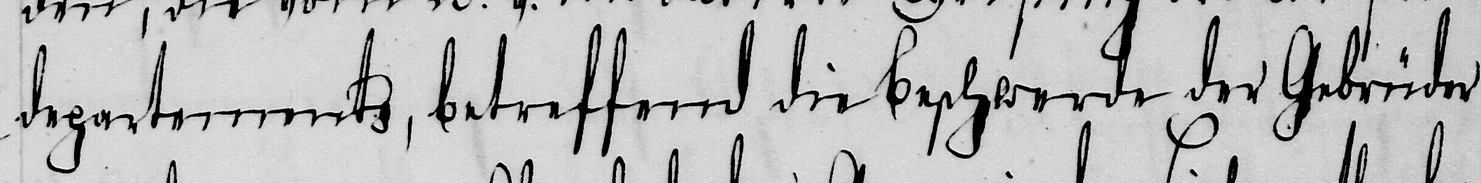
departements, betreffend die Beschwerde der Gebrüder
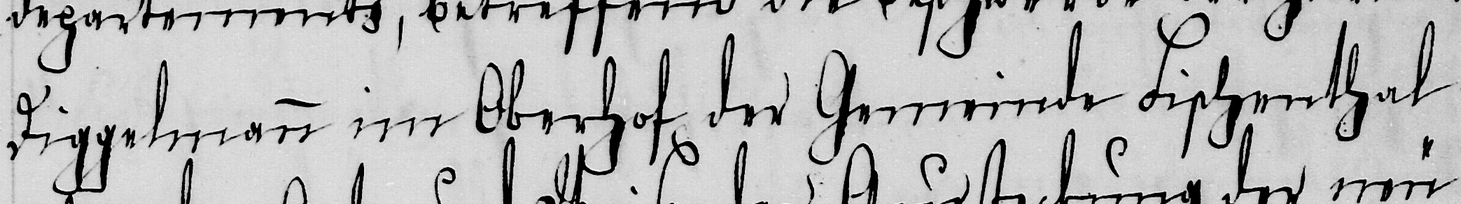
Diggelmann im Oberhof der Gemeinde Fischenthal
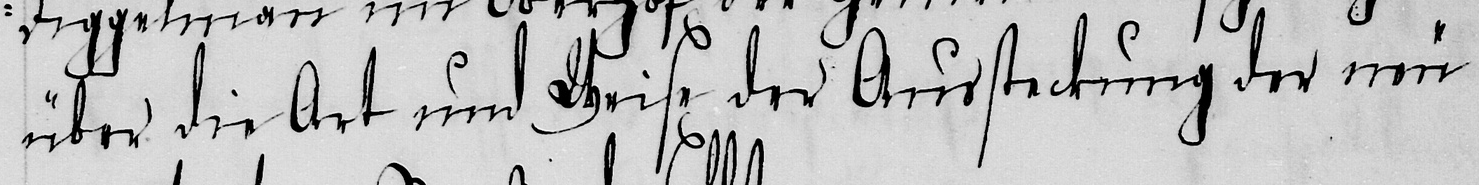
über die Art und Weise der Aussteckung der neu
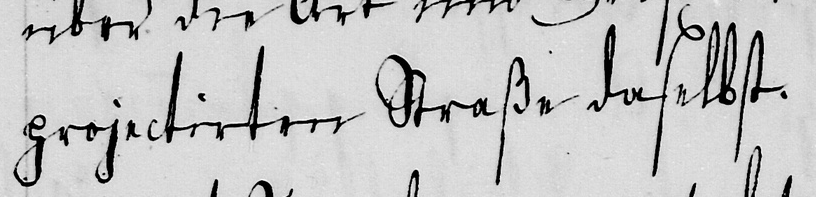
projectirten Straße daselbst.
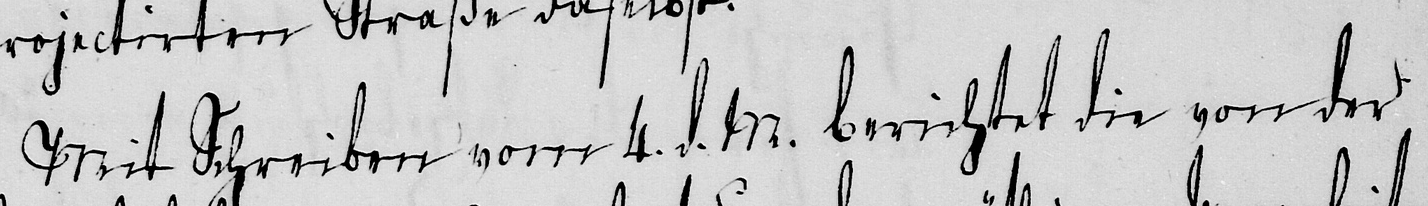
Mit Schreiben vom 4. d. M. berichtet die von der
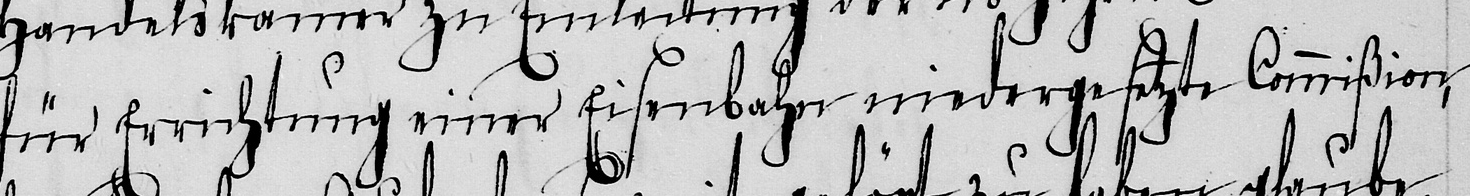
für Errichtung einer Eisenbahn niedergesetzte Commißion,
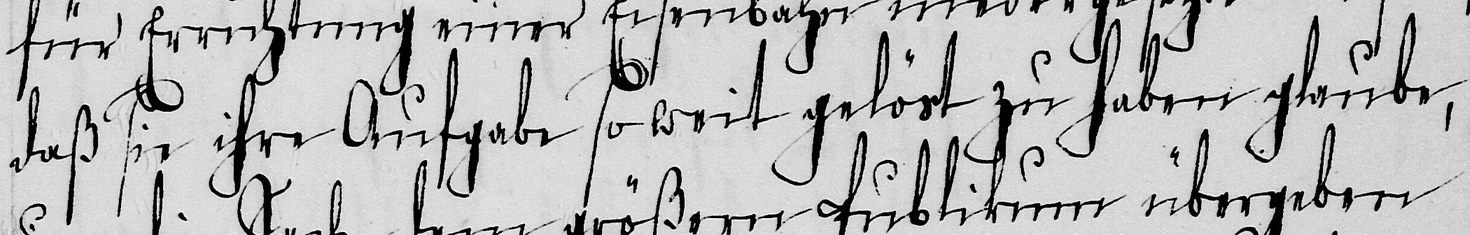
daß sie ihre Aufgabe so weit gelöst zu haben glaube,
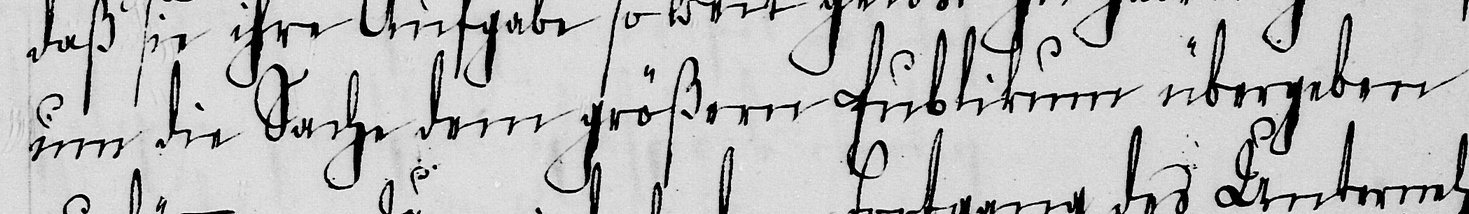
um die Sache dem größern Publikum übergeben
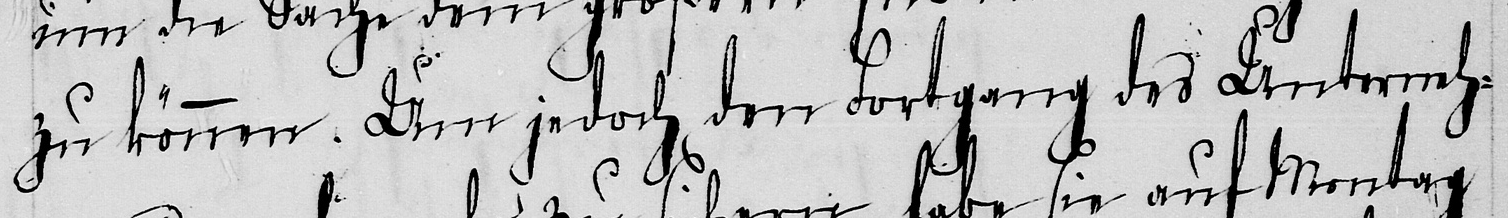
zu können. Um jedoch den Fortgang des Unterneh¬
